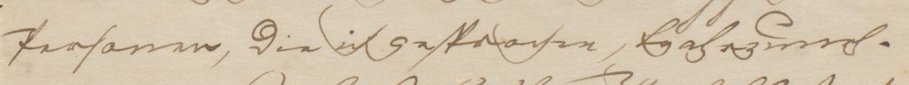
Personen, die ich gesprochen, wahrzuneh-
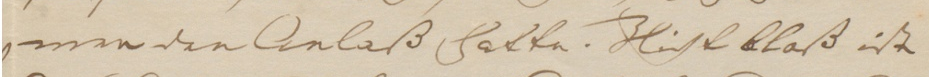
men den Anlaß hatte. Nicht bloß ist
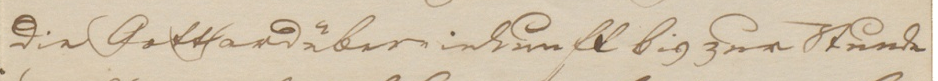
die Gotthardübereinkunft bis zur Stunde
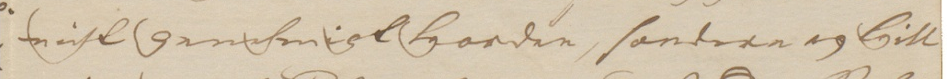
nicht genehmigt worden, sondern es will
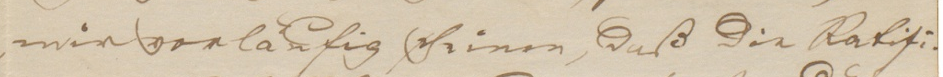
mir vorläufig scheinen, daß die Ratifi-
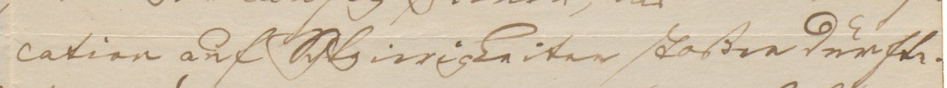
cation auf Schwierigkeiten stoßen dürfte.
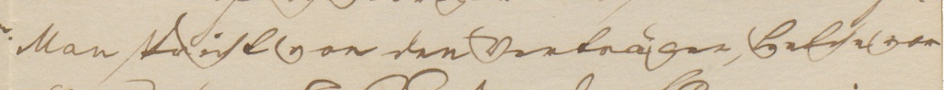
Man spricht von den Verträgen, welche vor
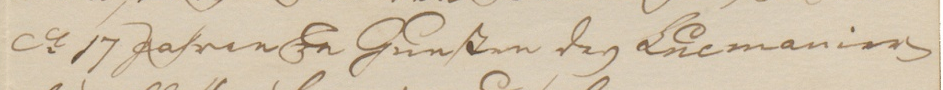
ca 17 Jahren zu Gunsten des Lucmanier
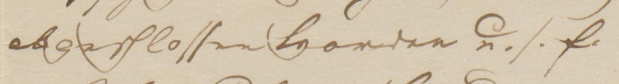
abgeschlossen worden u. s. f.
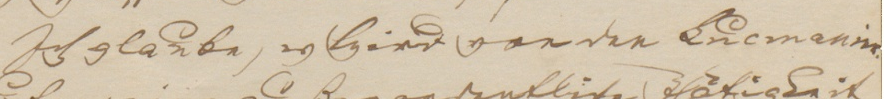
Ich glaube, es wird von den Lucmanier -
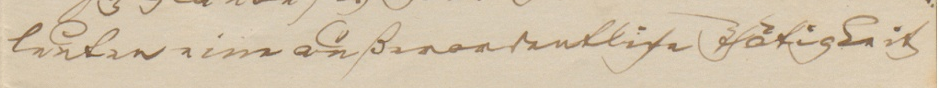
leuten eine außerordentliche Thätigkeit
